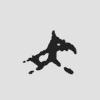夭
